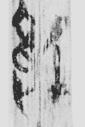食
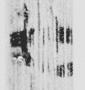也
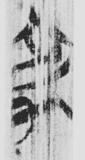害（曷）
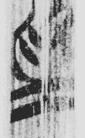爲
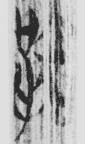鮑
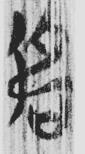叔
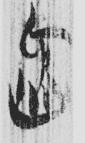牙
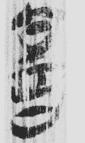答
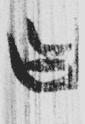曰
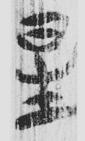星
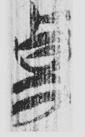○（變）
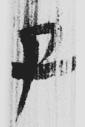子
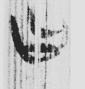曰
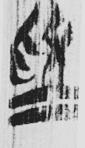爲
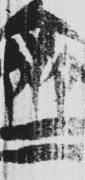齊
